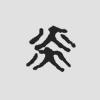炎
